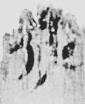幾（忌）
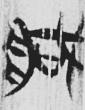○（莊）
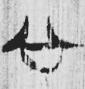公
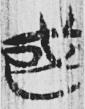或（又）
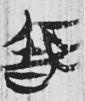䎽（問）
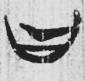曰
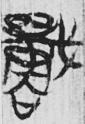○（戰）
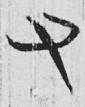又（有）
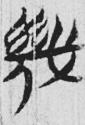幾（忌）
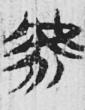{虍介}
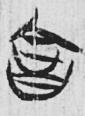合
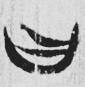曰
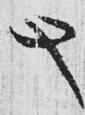又
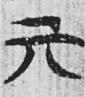亓
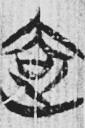{去止}（去）
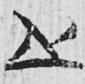之
